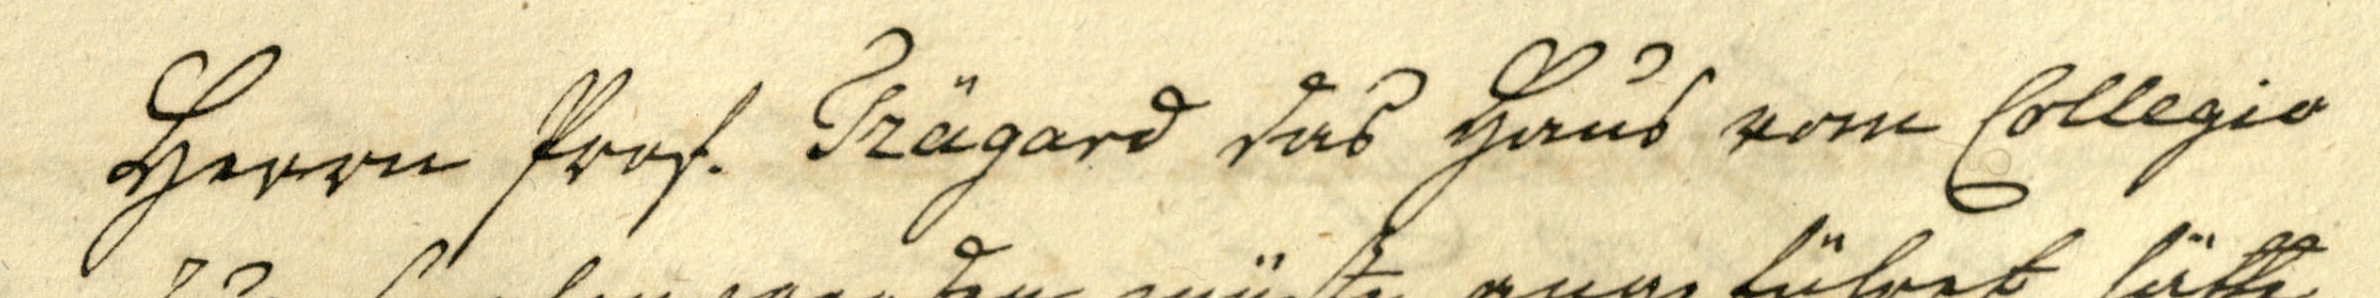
Herrn Prof. Trägård das Haus vom Collegio
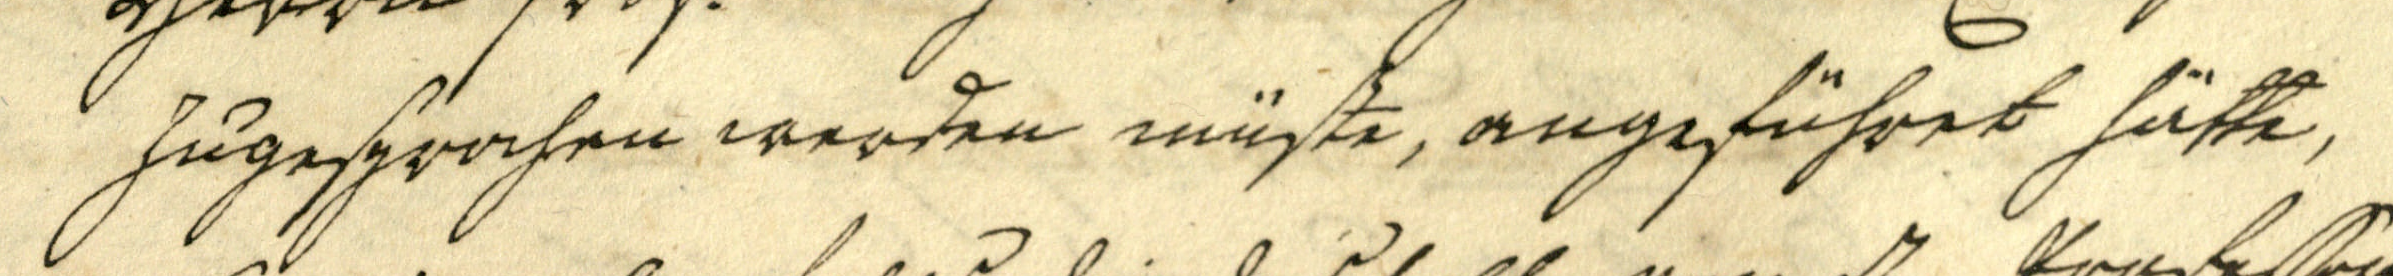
zugesprochen werden müßte, angeführet hätte,
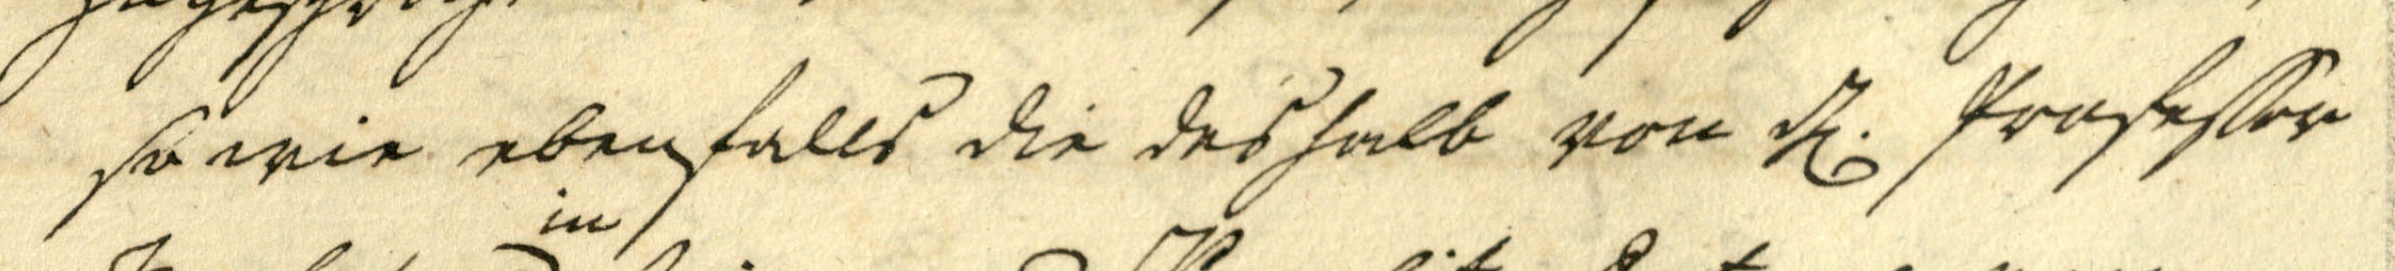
so wie ebenfalls die des halb von dh. Professor
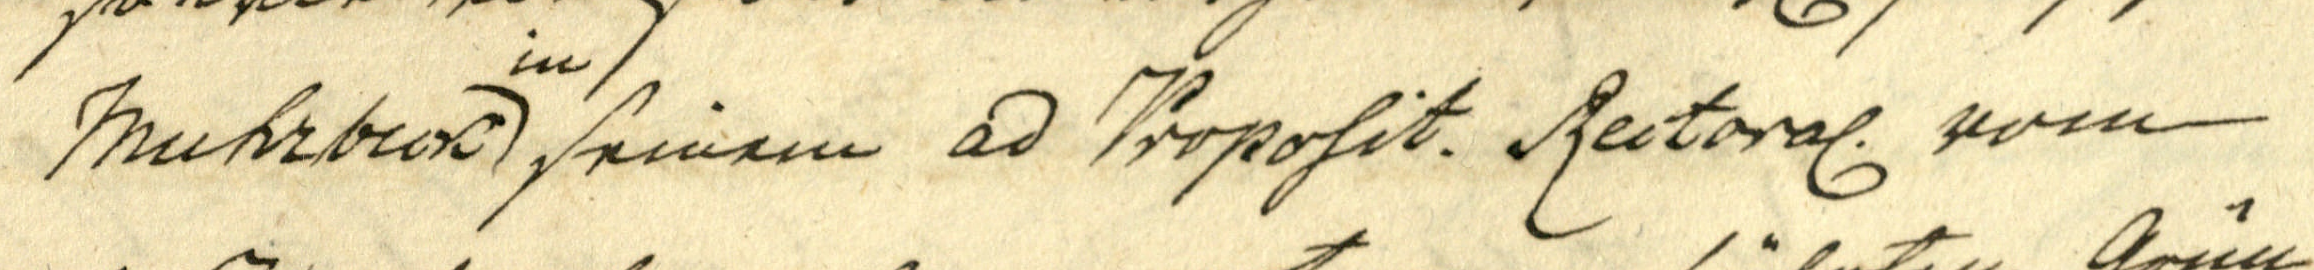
Muhrbeck in seinem ad Proposit. Rectoral. vom
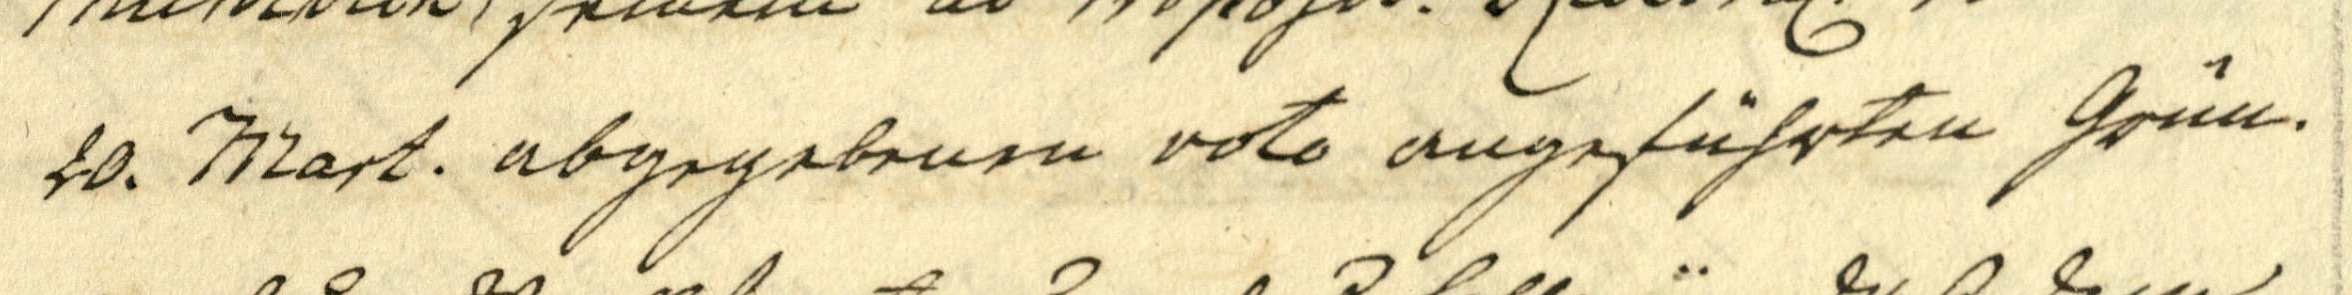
20. Mart. abgegebenen voto angeführten Grün¬
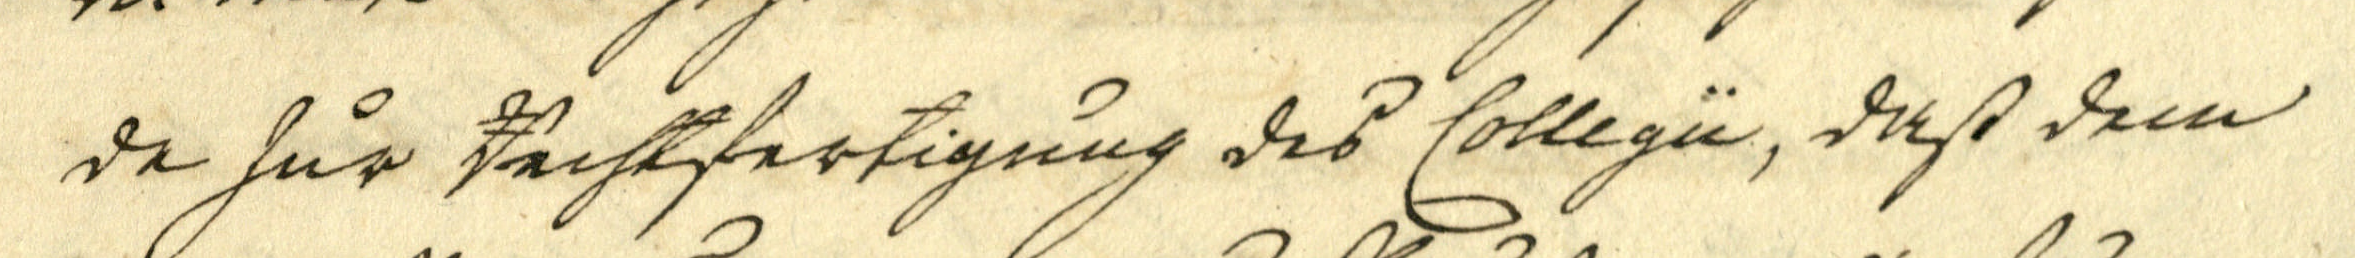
de zur Rechtfertigung des Collegii, daß dem
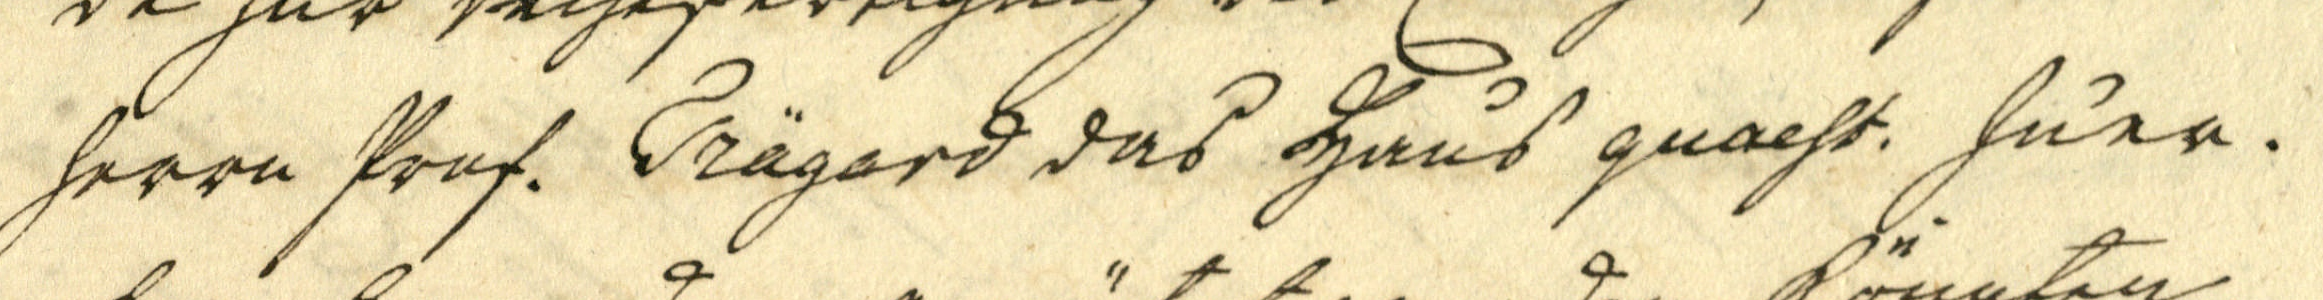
Herrn Prof. Trägård das Haus quaest. zuer¬
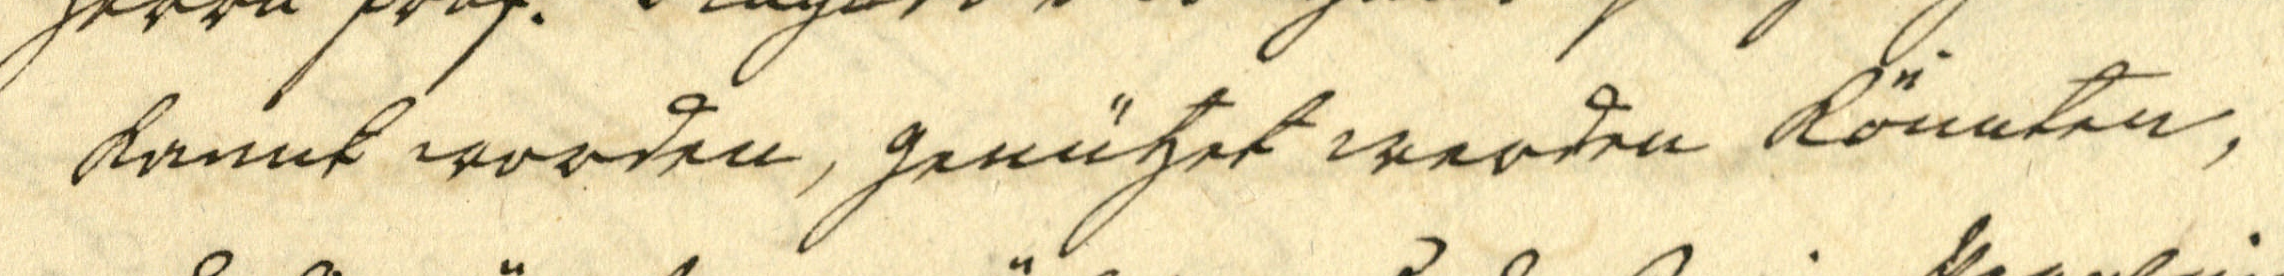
kannt worden, genützet werden könnten,
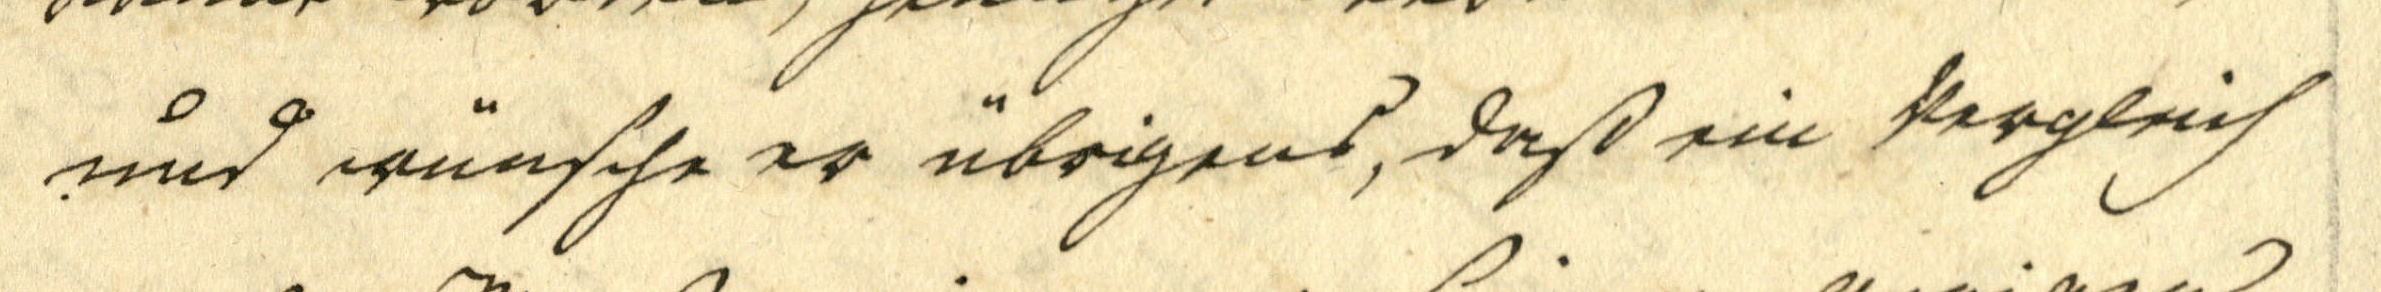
und wünsche er übrigens, daß ein Vergleich
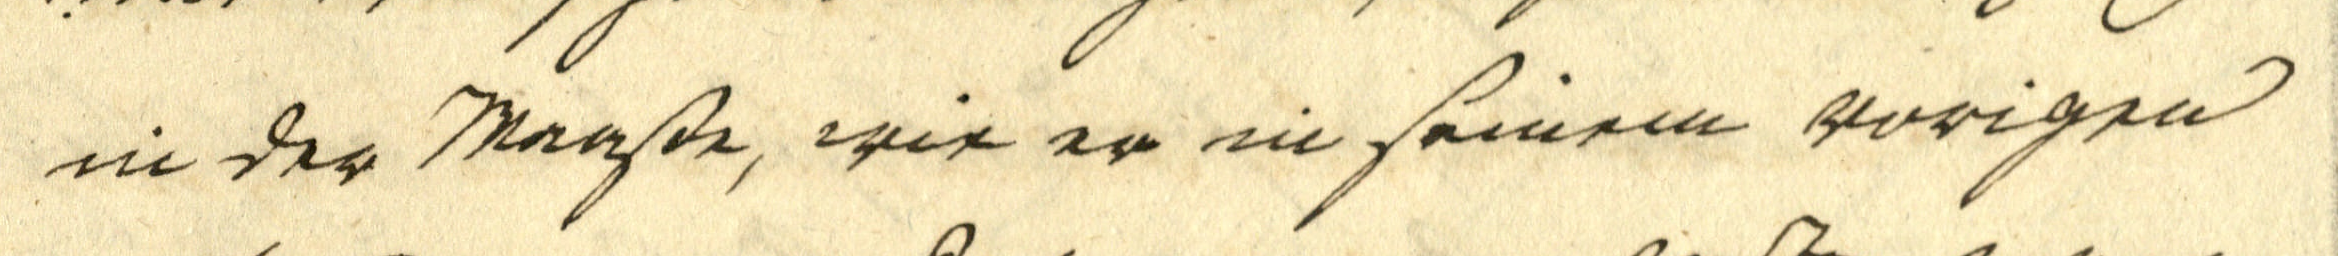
in der Maaße, wie er in seinem vorigen
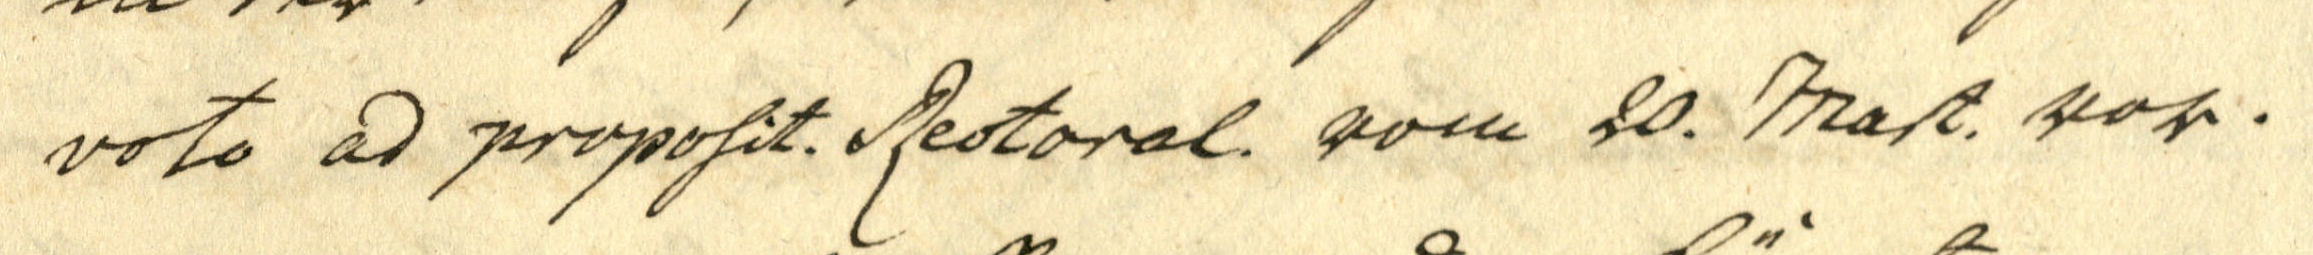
voto ad proposit. Rectoral. vom 20. Mart. vor¬
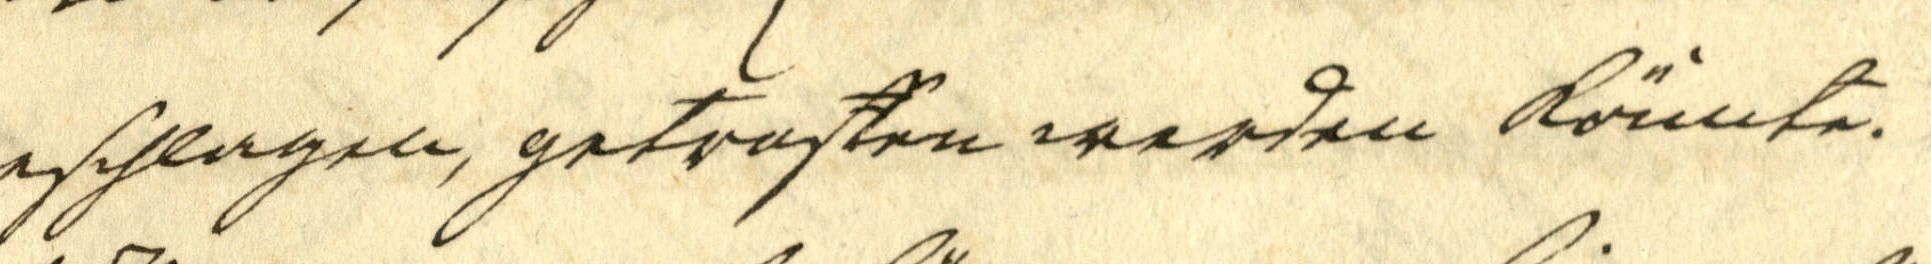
geschlagen, getroffen werden könnte.
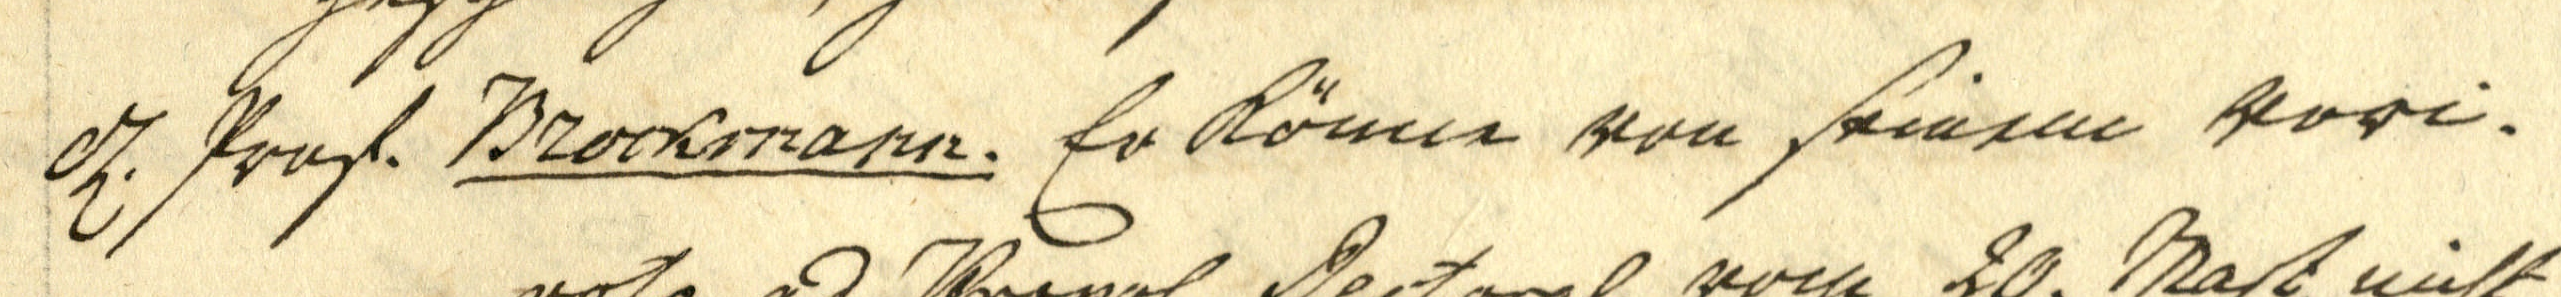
dh. Prof. Brockmann. Er könne von seinem vori¬
